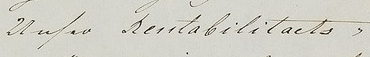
Unser Rentabilitaets -
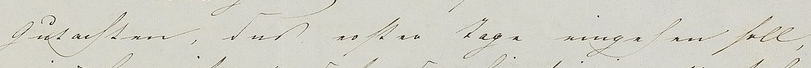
Gutachten, das erster Tage eingehen soll,
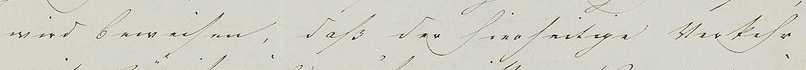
wird beweisen, daß der hierseitige Verkehr
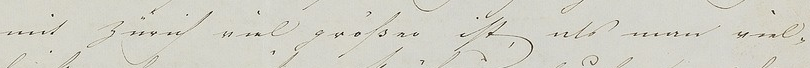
mit Zürich viel größer ist, als man viel-
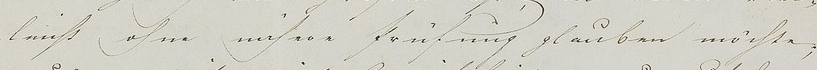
leicht ohne nähere Prüfung glauben möchte;
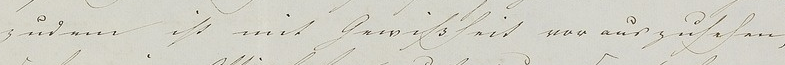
zudem ist mit Gewißheit vorauszusehen,
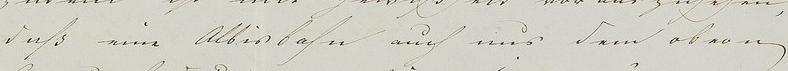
daß eine Albisbahn auch aus dem obern
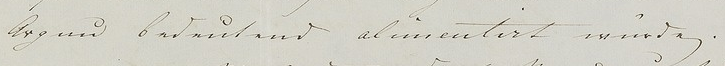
Argau bedeutend alimentirt würde.
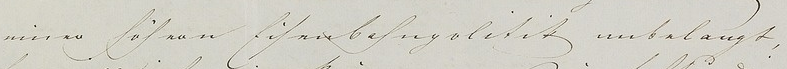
einer höhern Eisenbahnpolitik anbelangt,
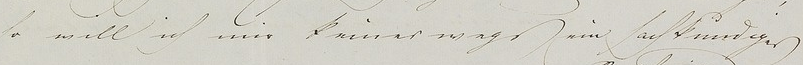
so will ich mir keineswegs ein sachkundiges
